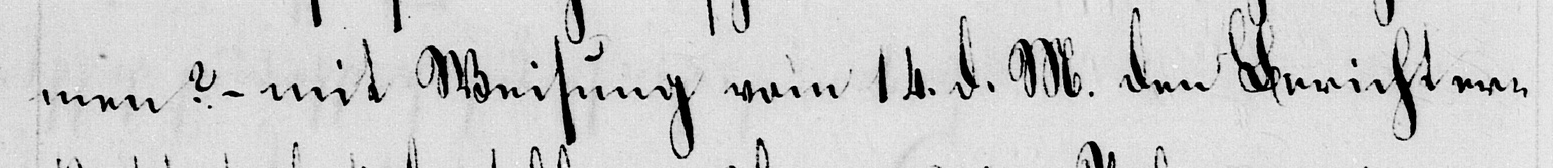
men?[“] – mit Weisung vom 14. d. M. den Bericht er¬
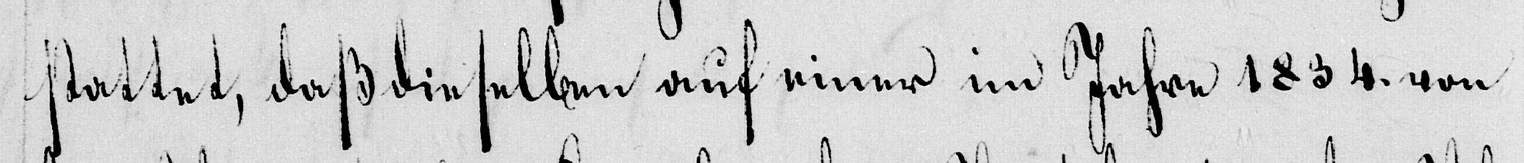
stattet, daß dieselben auf einer im Jahre 1834. von
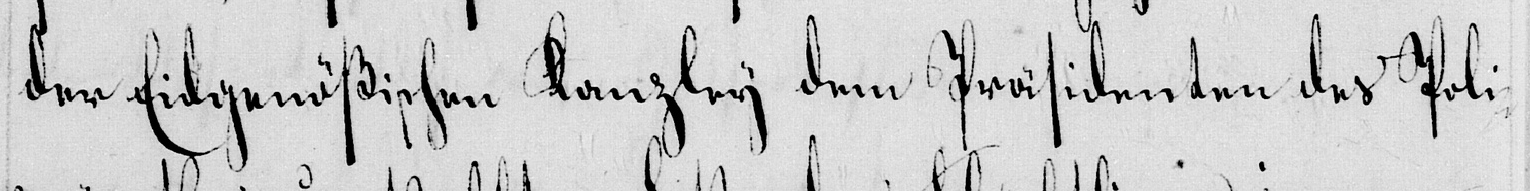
der Eidgenößischen Kanzley dem Präsidenten des Poli¬
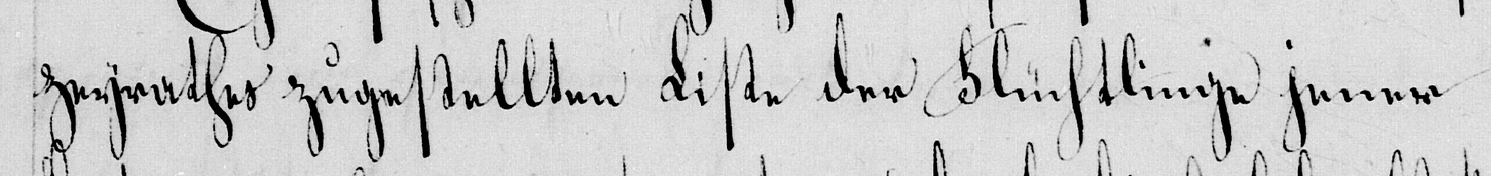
zeyrathes zugestellten Liste der Flüchtlinge jener
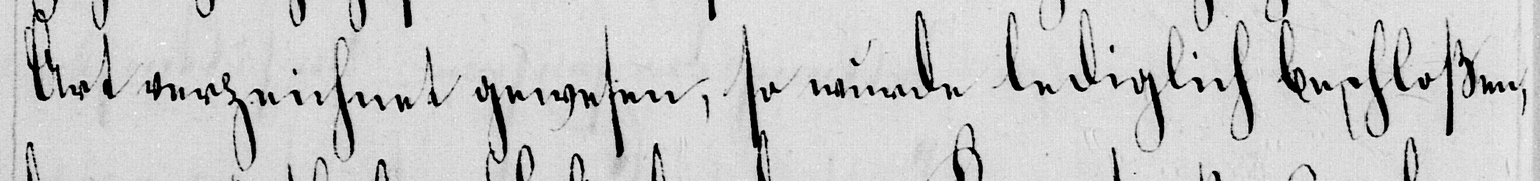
Art verzeichnet gewesen, so wurde lediglich beschloßen,
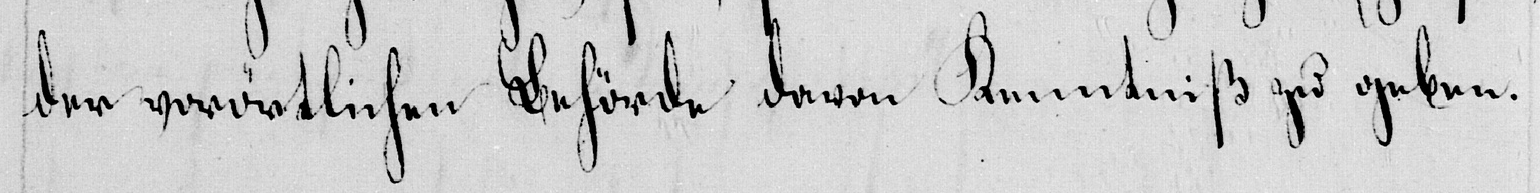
der vorörtlichen Behörde davon Kenntniß zu geben.
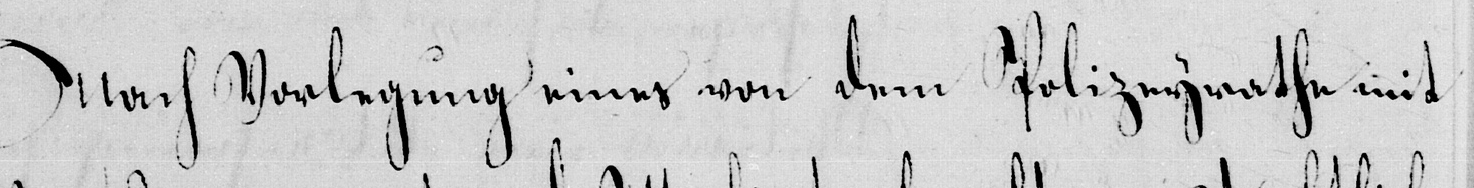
Nach Vorlegung eines von dem Polizeyrathe mit
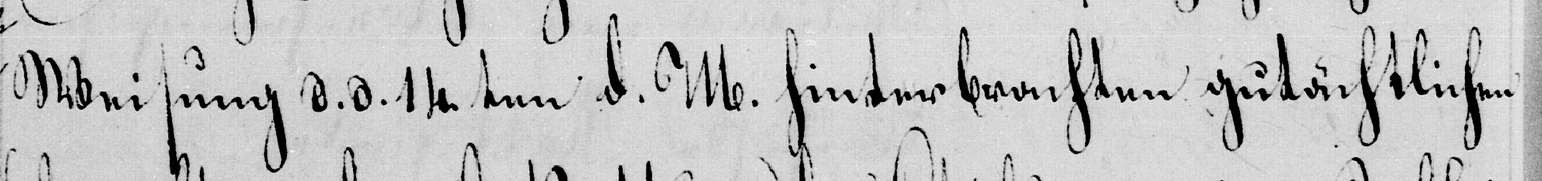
Weisung d. d. 14ten d. M. hinterbrachten gutächtlichen
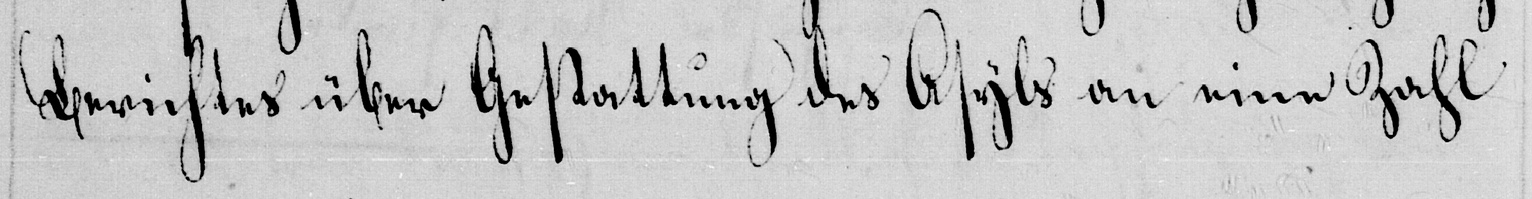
Berichtes über Gestattung des Asyls an eine Zahl
